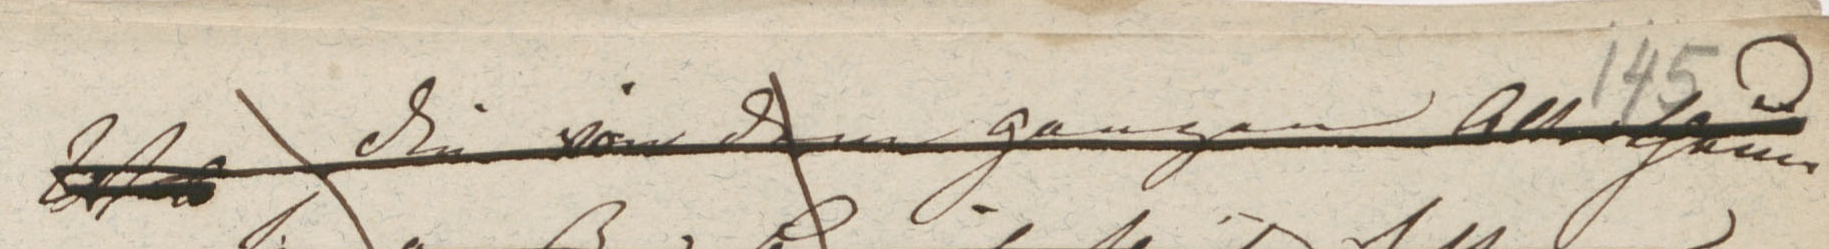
Was die von dem ganzen Alterthume
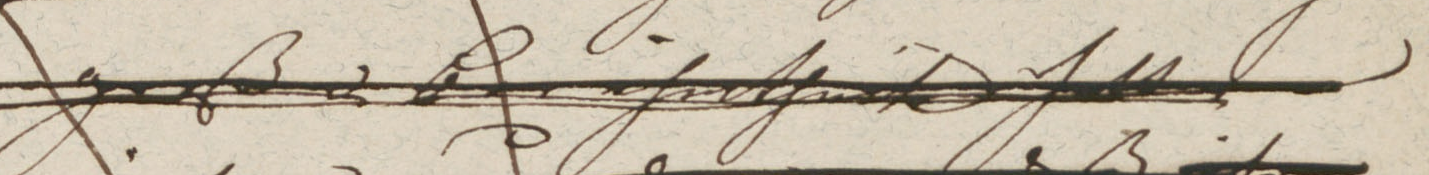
so grosse Berühmtheit hatten
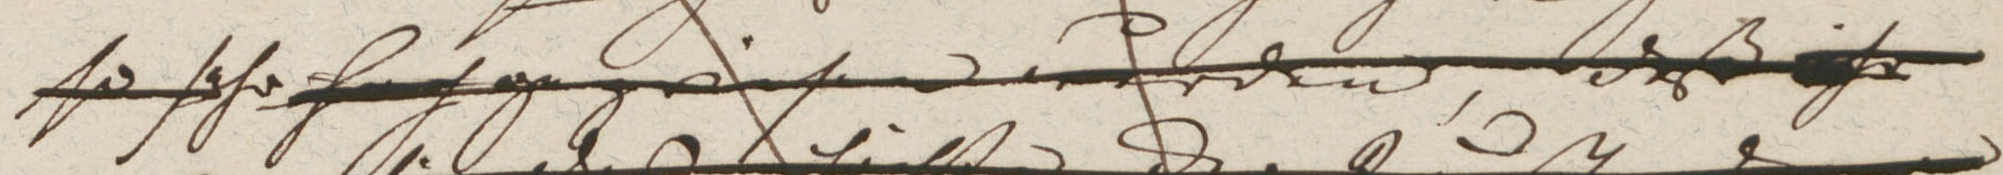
so sehr hoch gepriesen wurden, dass ihr
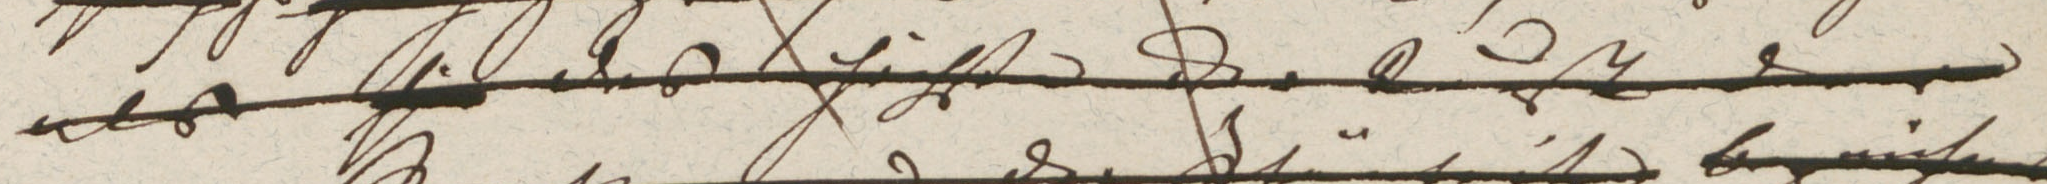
als sie das höchste der Kunst der
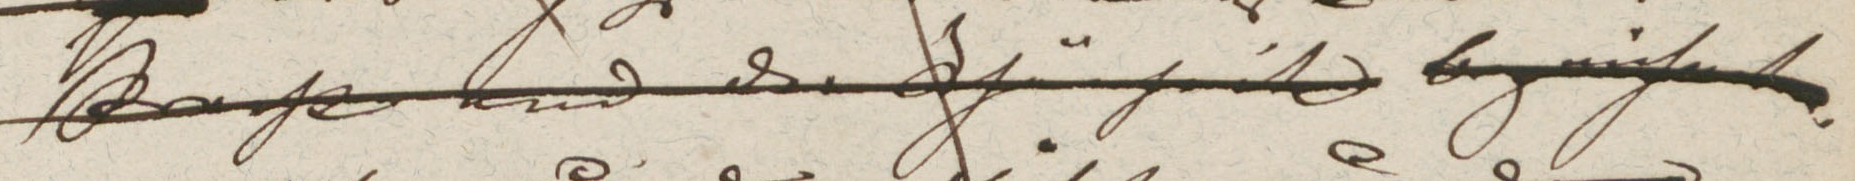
Pracht und der Schönheit bezeichnete
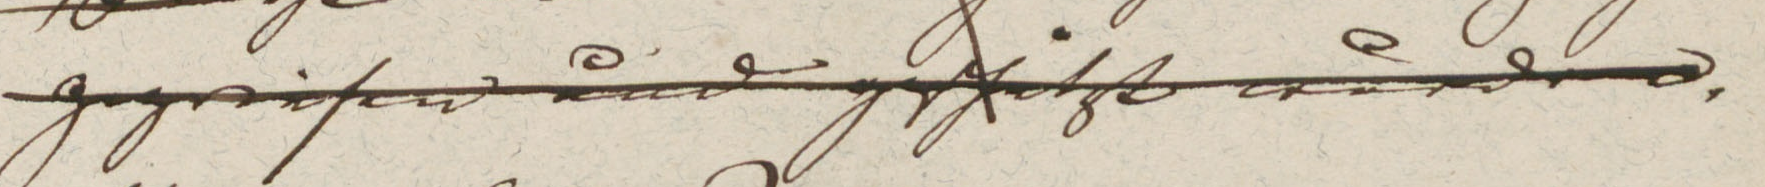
gepriesen und geschätzt wurden.
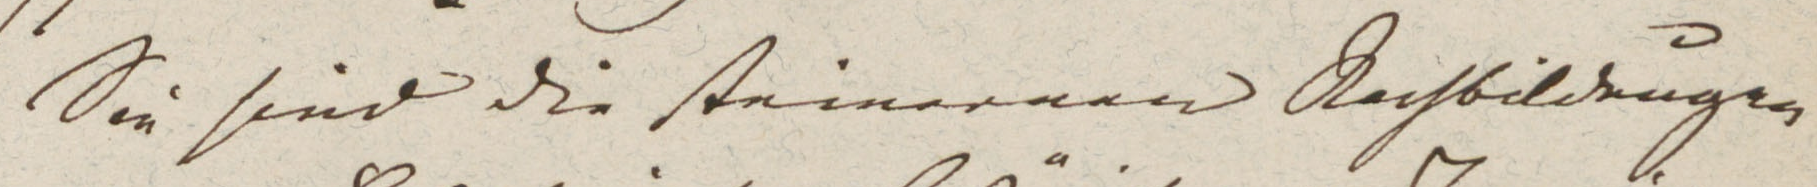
Sie sind die steinernen Nachbildungen
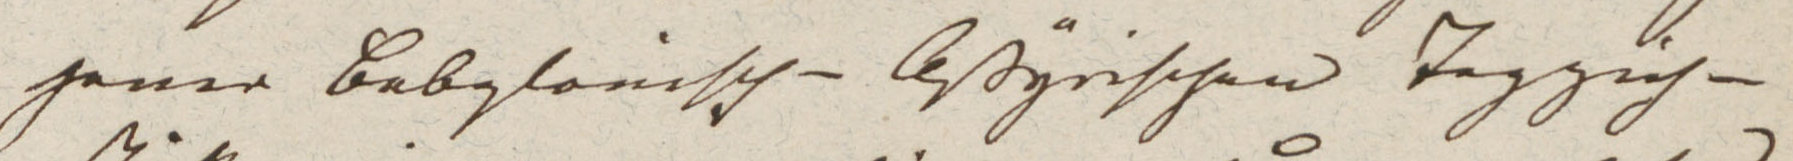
jener Babylonisch-Assyrischen Teppich-
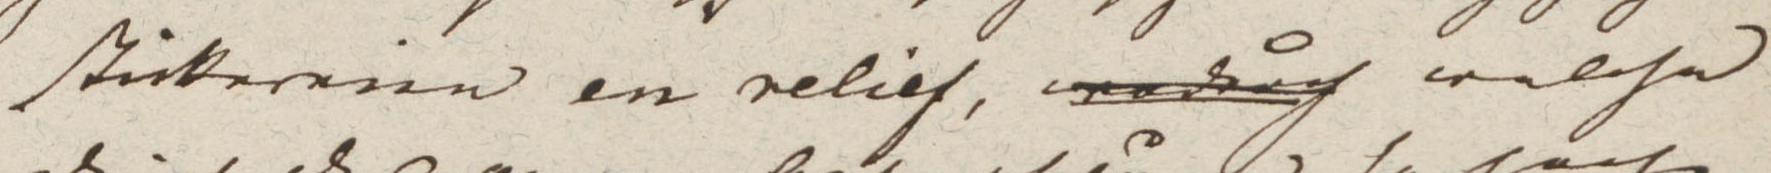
stickereien en relief, wodurch welche
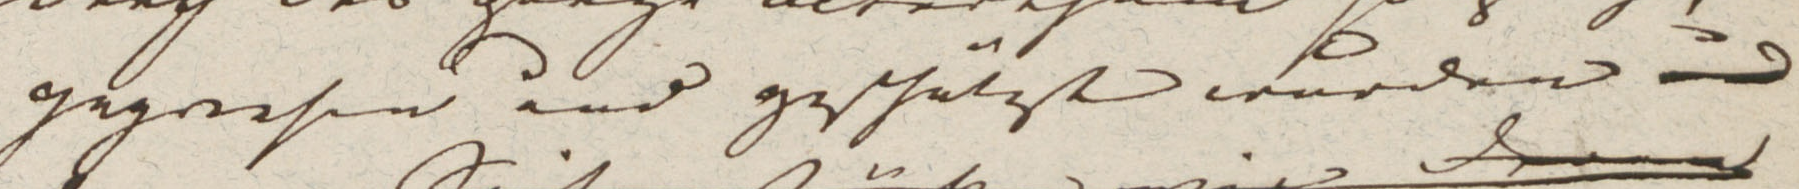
gepriesen und geschätzt wurden und
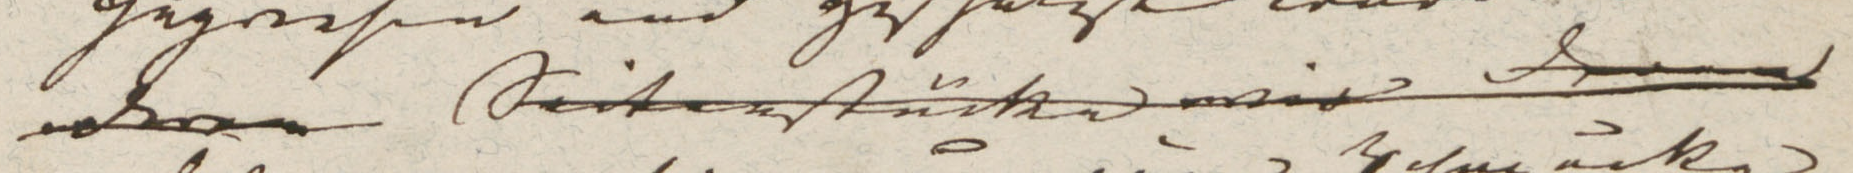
deren Seitenstücke wir deren
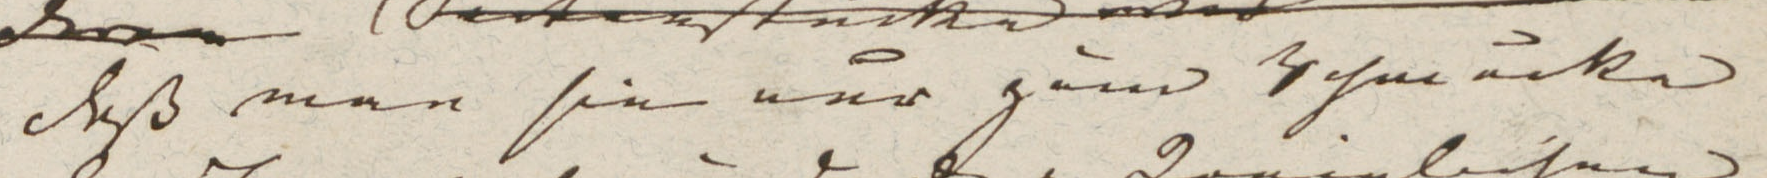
dass man sie nur zum Schmucke
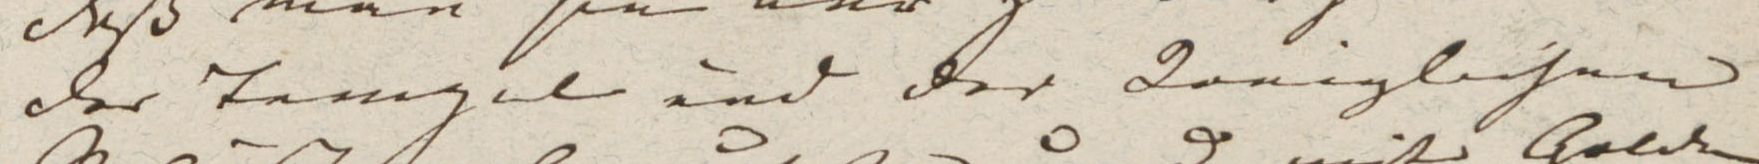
der Tempel und der Koniglichen
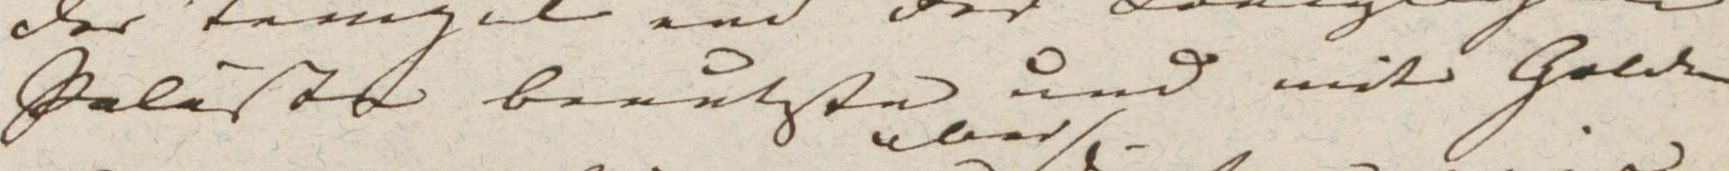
Paläste benutzte und mit Golde
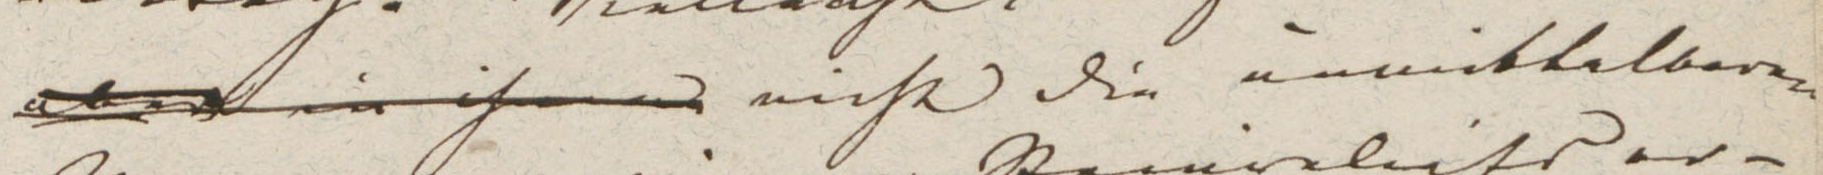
aber in ihnen nicht die unmittelbaren
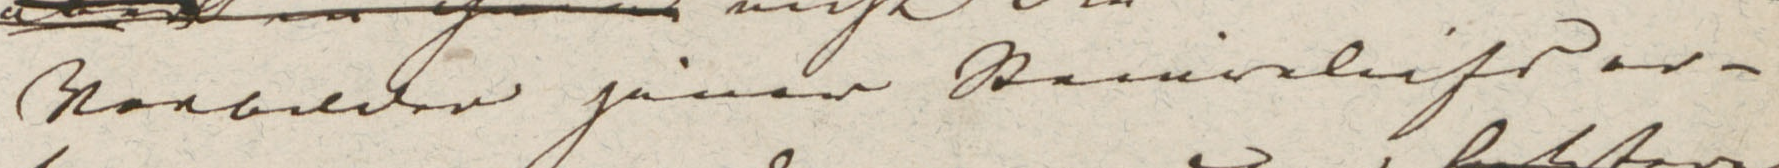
Vorbilder jener Steinreliefs er-
